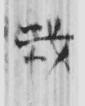戎
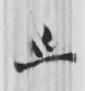之
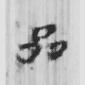厽
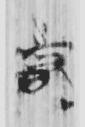時
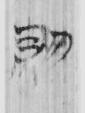則
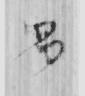多
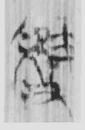{禾隻}
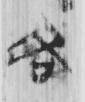各
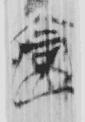當
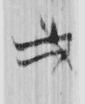𭟮
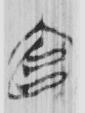官
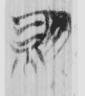則
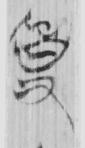事
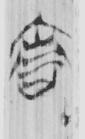寈
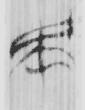民
